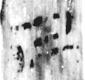己
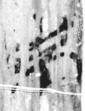未
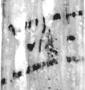壬
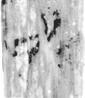戌
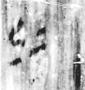㠯（以）
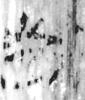折（製）
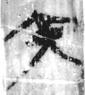內
